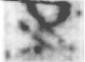之
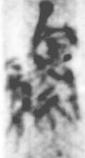顯（韅）
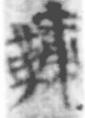鞅
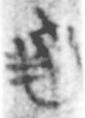○（絶）
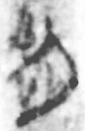絶
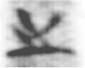之
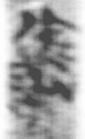雘
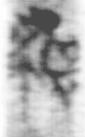紳（靷）
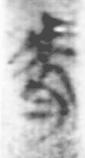○（虎）
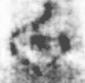首
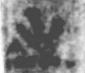之
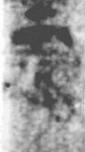○（蒙）
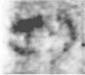四
